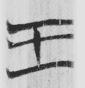王
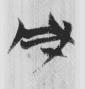凡
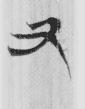又
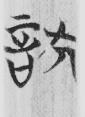{言犬}
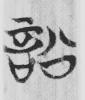訟
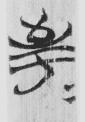{至于}=
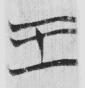王
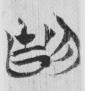廷
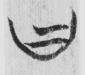曰
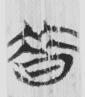昔
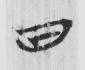日
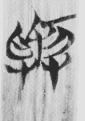與
